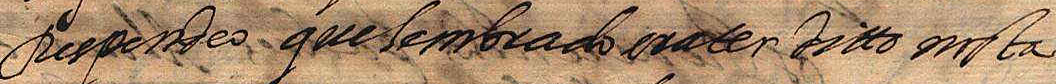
Respondeo que lembrado era ter ditto nesta
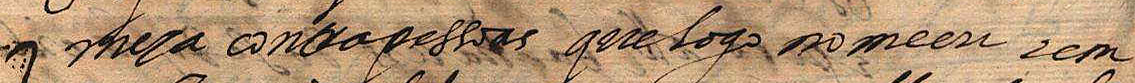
meza contra pessoas que logo nomeou e em
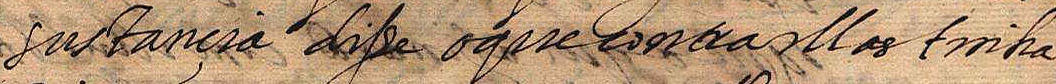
sustancia disse o que contra ellas tinha
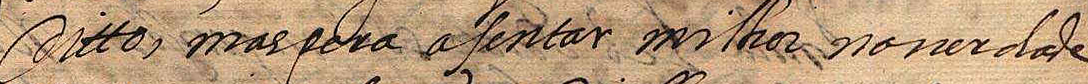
ditto, mas pera asentar milhor na uerdade
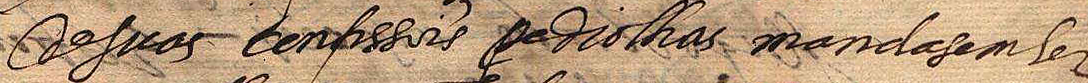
de suas confissoīs pediolhas mandasem ler
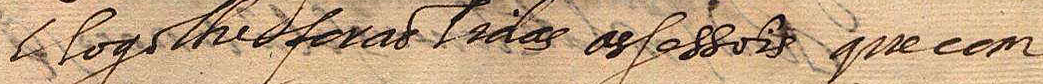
E logo lhe foraõ lidas as sessoīs que com
